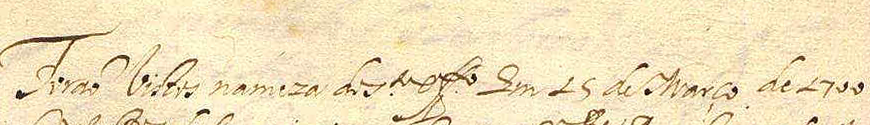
Foraõ Vistos na meza do s.to off.o Em 15 de Março de 1700
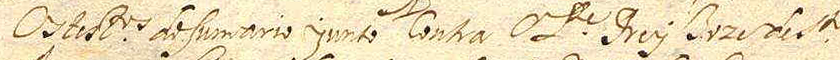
Os test.os de sumario junto contra O P.e Frey Ioze de Sto
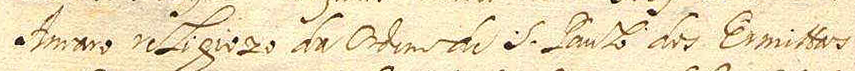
Amaro religiozo da Ordem de .S. Paulo dos Ermittas
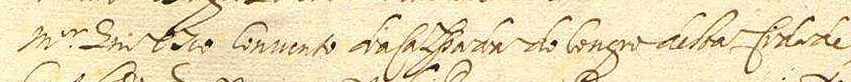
m.or Em o seo Conuento da Calssada do Congro desta Cidade
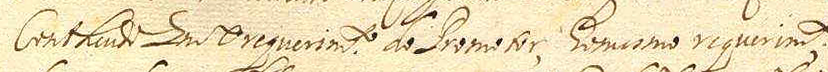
Contheudo Em O requerim.to do Promotor E o mesmo requerim.to
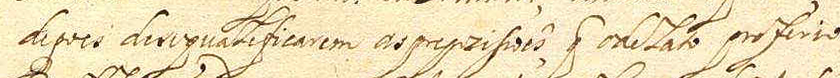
depoes de se qualeficarem as prepozissoẽs, q̄ o delato proferio
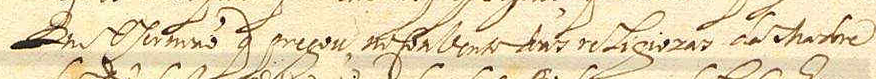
Em O sermaõ q̄ pregou, no Convento das religiozas da Madre
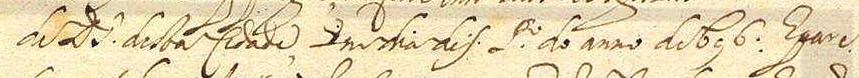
de Ds̄. desta Cidade, e no dia de S. P.o do anno de 696: E pare
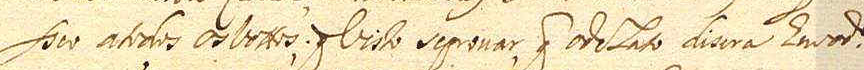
sser a todos os vottos: q̄ Visto se prouar q̄ o deLato disera E no d.o
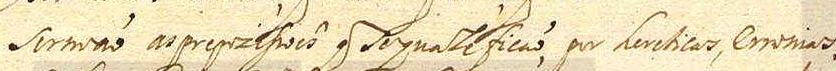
sermaõ as prepozissoẽs q̄ se qualeficaõ, por hereticas, erronias,
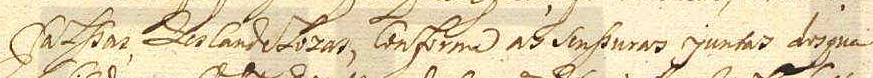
falssas, E escandeLozas, conforme as senssuras juntas dos qua
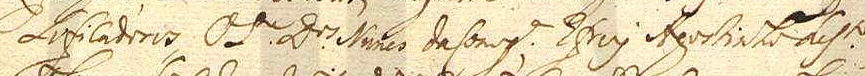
Lificadores, O P.e D.os Nunes da Comp.a e frey Agostinho de s.to
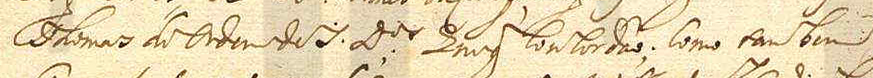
Thomas do Ordem de S. D.os E no q̄ concordaõ. Como tambem
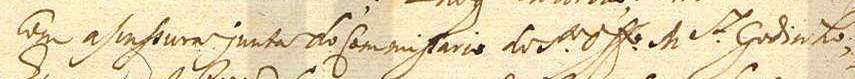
com a senssura junta do Commissario do S.to off.o Mel. Godinho,
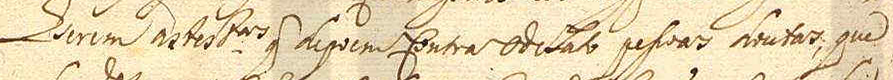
E serem as test.as q̄ depoem Contra o delato pessoas doutas, que
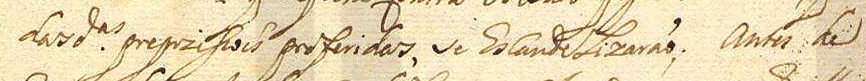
das d.as prepozissoẽs proferidas, se EscandeLizarão; antes de
